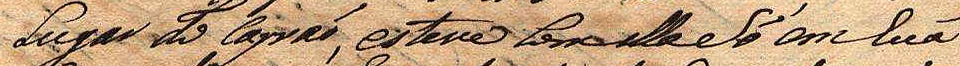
Lugar do Cayraõ, esteue Com ella Só em huā
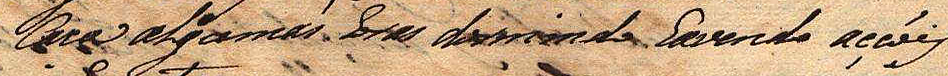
Caza algumas horas dormindo havendo acçõis
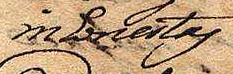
inhonestas
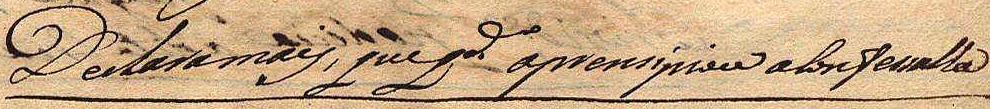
Declara mais, que qd.o o prensipiou a Confessalla
